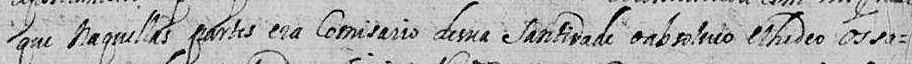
que naquellas partes era Comisario de sua Santidade o absolueo e lhe deo os sa
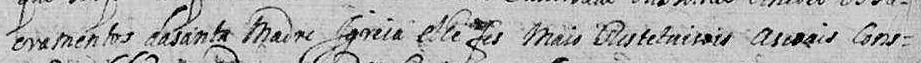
cramentos da santa Madre Jgreia e lhe fes mais Restetuiçois as coais cons
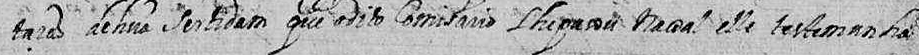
tarã de huã sertidam que o dito Comisario lhe pasou na coal elle testemunha
